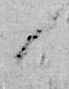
d.
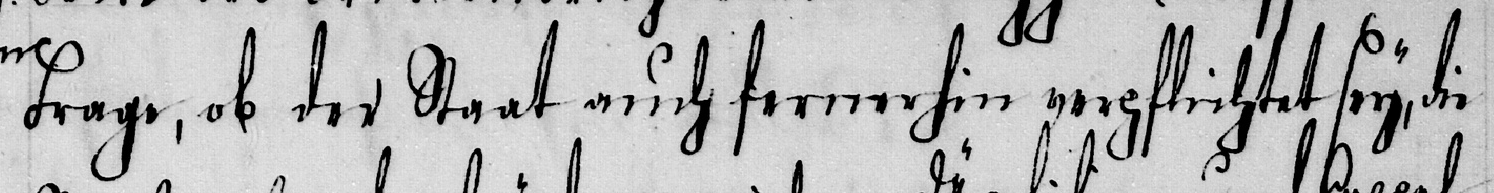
Frage, ob der Staat auch fernerhin verpflichtet sey, d¬
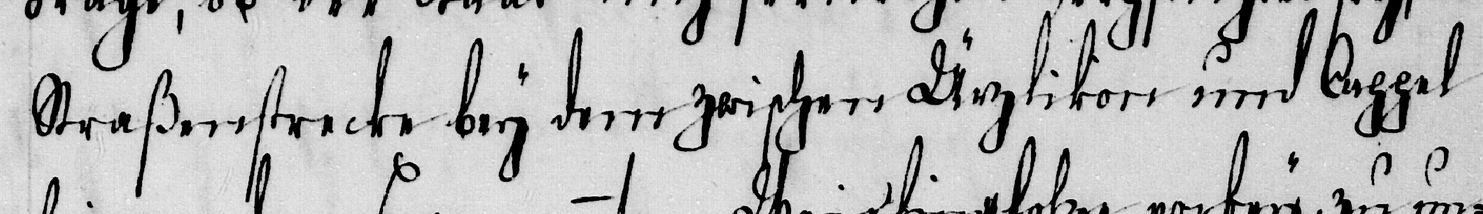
Straßenstrecke bey dem zwischen Ürzlikon und Cappel
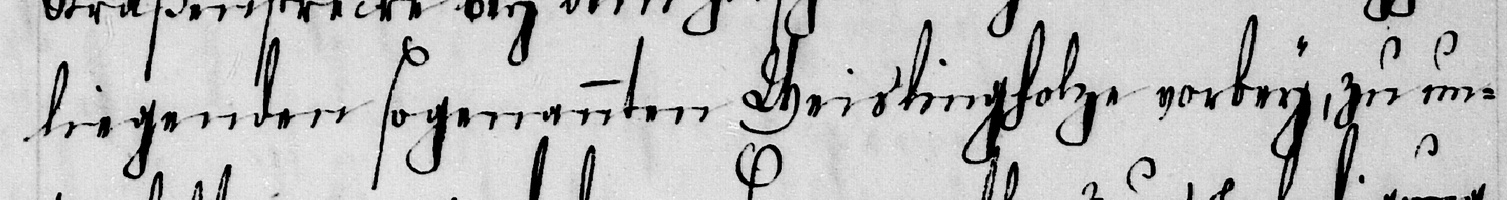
liegenden sogenannten Weislingholze vorbey, zu un¬
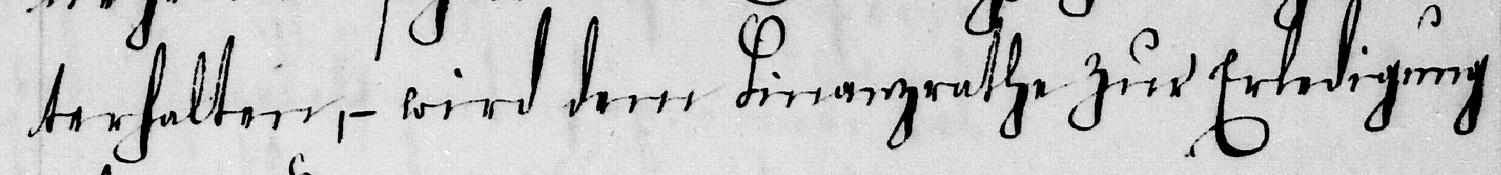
terhalten,– wird dem Finanzrathe zur Erledigung
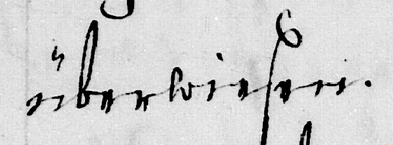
überwiesen.
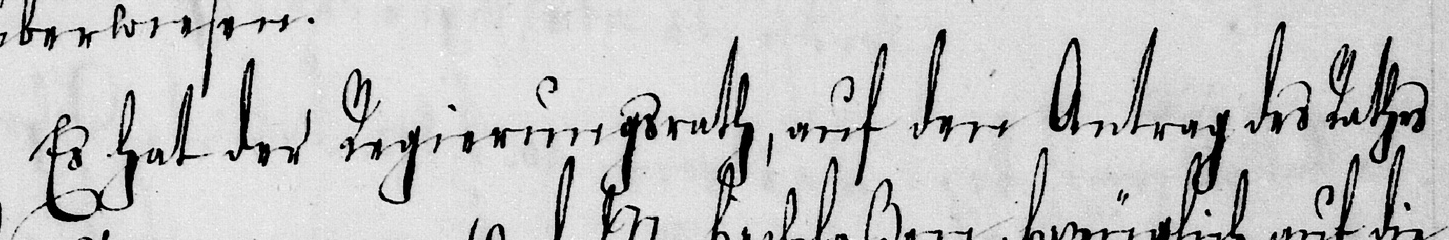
Es hat der Regierungsrath, auf Antrag des Rath¬
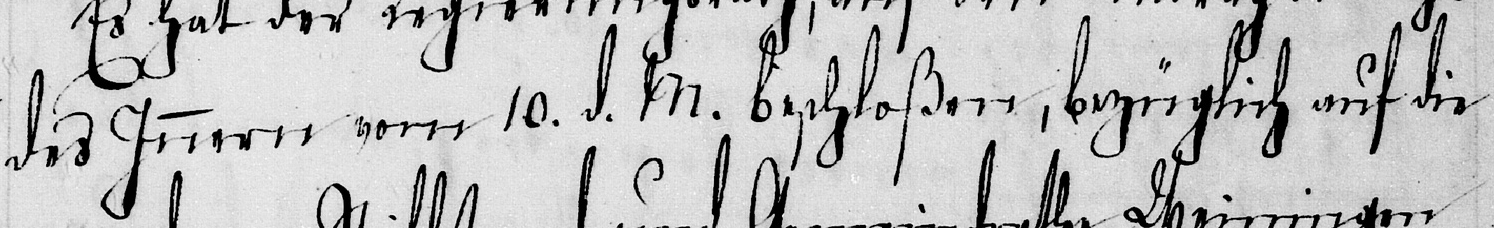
des Innern vom 10. d. M. beschloßen, bezüglich auf die
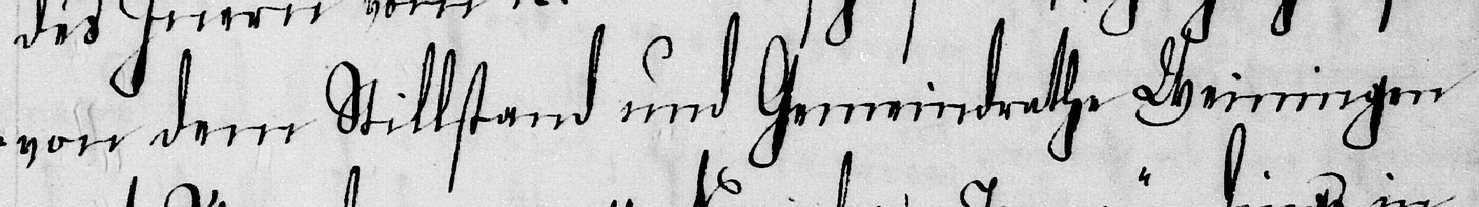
von dem Stillstand und Gemeindrathe Weiningen
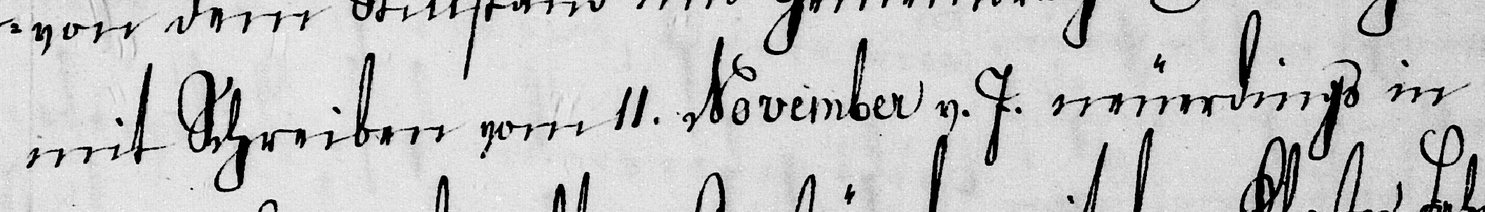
mit Schreiben vom 11. November v. J. neuerdings in
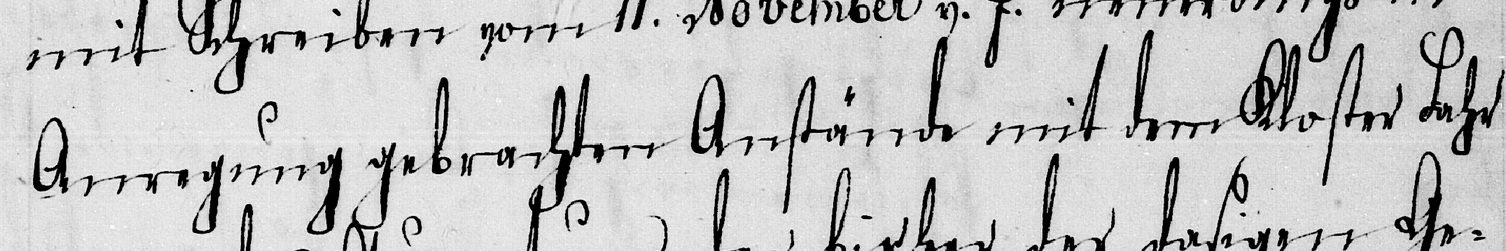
Anregung gebrachten Anstände mit dem Kloster Fahr
